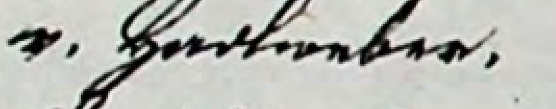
v. Hartweber,
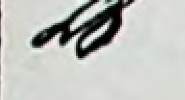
28
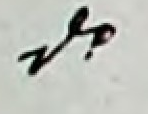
Do
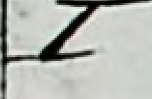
I
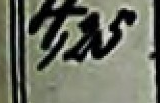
4,25
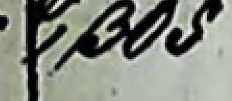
0,305
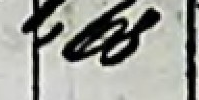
1,68
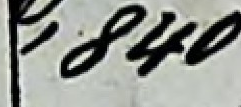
0,840
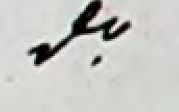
Do
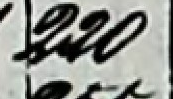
220
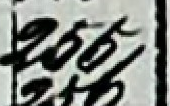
255
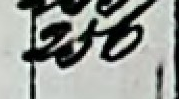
256
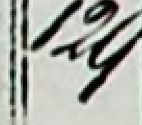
129
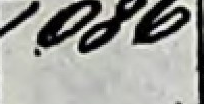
0,086
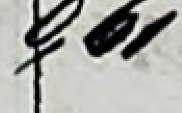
0,61
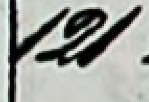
121
